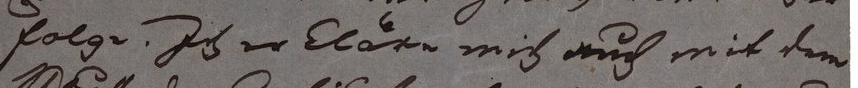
Folge. Ich erkläre mich auch mit dem
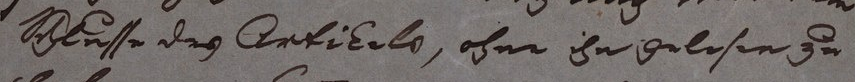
Schlusse des Artikels, ohne ihn gelesen zu
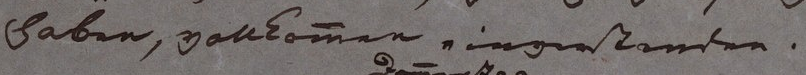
haben, vollkommen einverstanden.
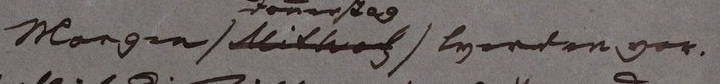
Morgen (Mitwoch) Donnerstag werden vor-
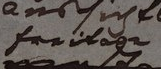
Freitage
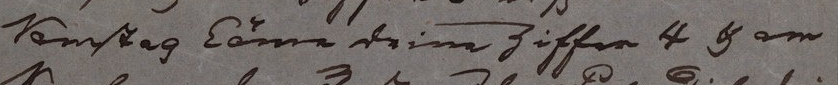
Samstag käme Deine Ziffer 4 & am
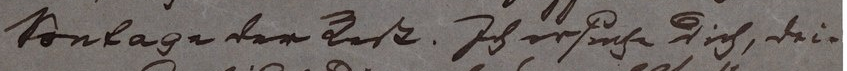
Sontage der Rest. Ich ersuche Dich, Dei-
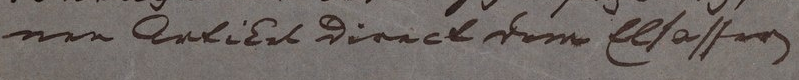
nen Artikel direct dem Elsasser
